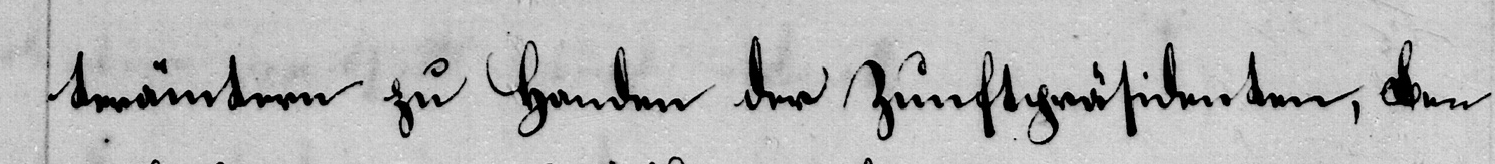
terämtern zu Handen der Zunftpräsidenten, Be¬
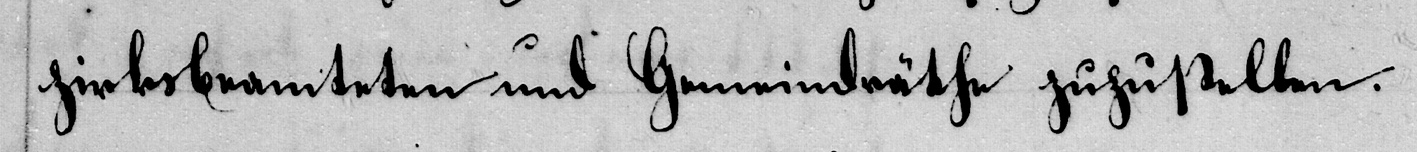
zirksbeamteten und Gemeindräthe zuzustellen.
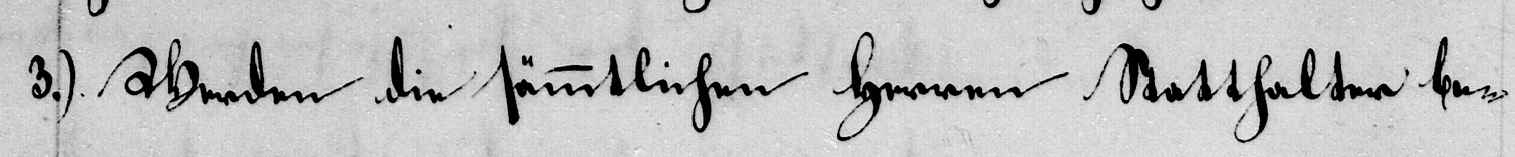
3.) Werden die sämmtlichen Herren Statthalter be¬
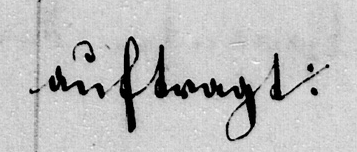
auftragt:
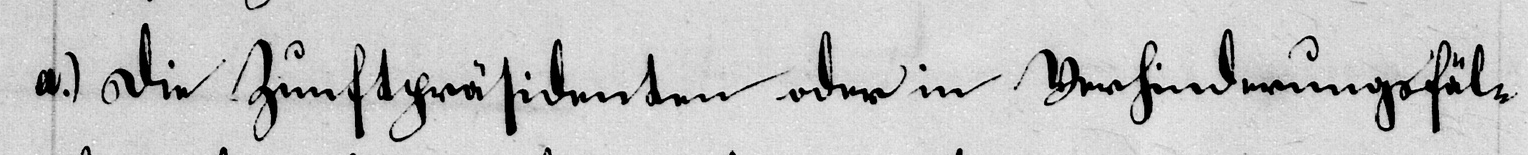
a.) Die Zunftpräsidenten oder in Verhinderungsfäl¬
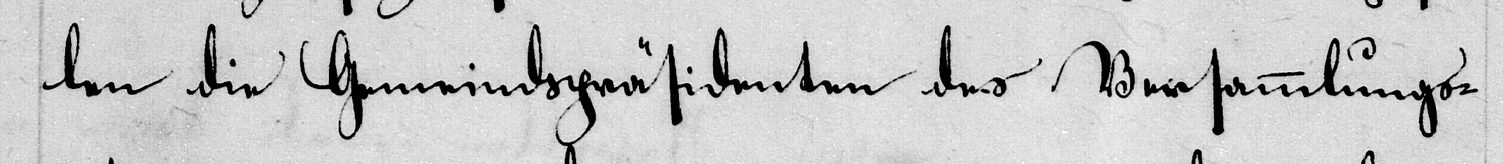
len die Gemeindspräsidenten des Versammlungs¬
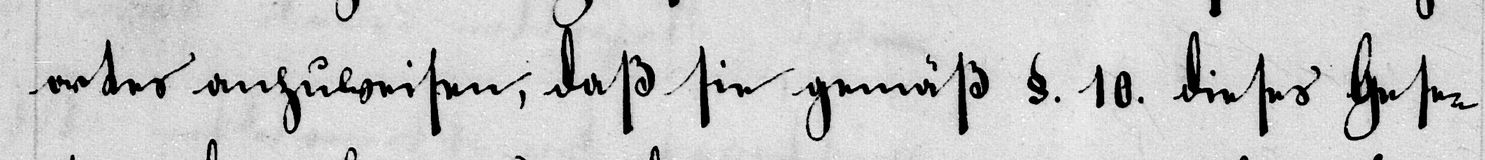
ortes anzuweisen, daß sie gemäß §. 10. dieses Gese¬
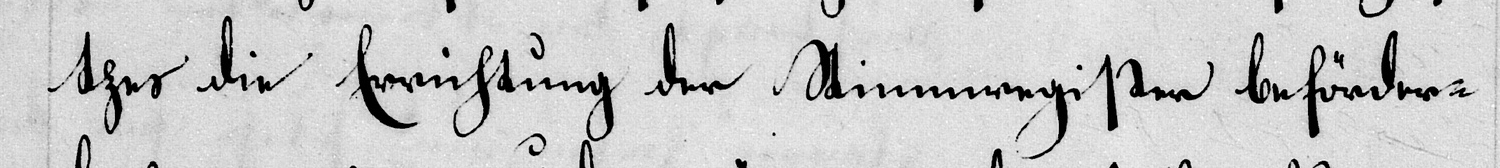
tzes die Errichtung der Stimmregister beförder¬
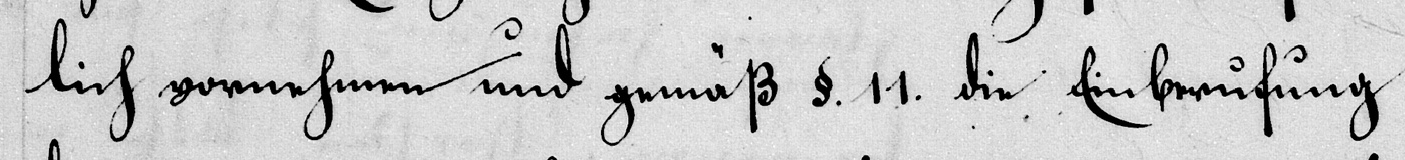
lich vornehmen und gemäß §. 11. die Einberufung
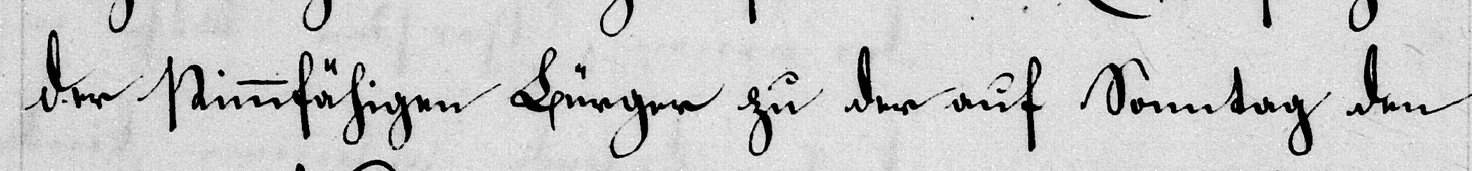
der stimmfähigen Bürger zu der auf Sonntag den
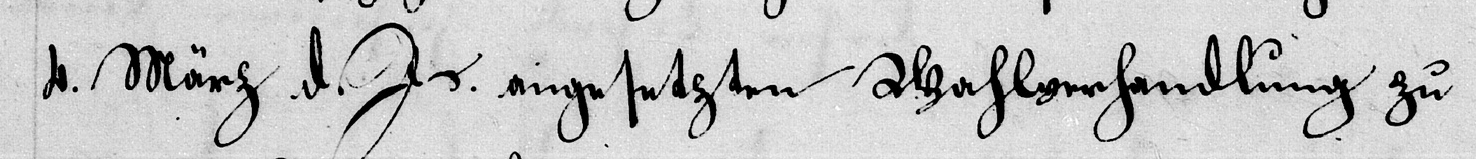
4. März d. Js. angesetzten Wahlverhandlung zu
